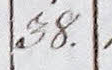38.
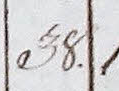38.
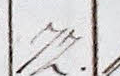72.
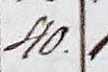40.
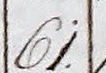61.
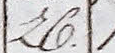26.
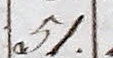51.
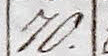70.
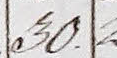30.
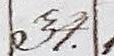34.
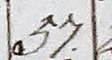57.
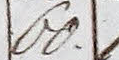60.
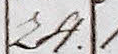24.
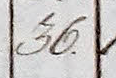36.
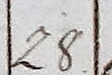28
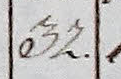32.
